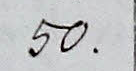50.
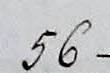56
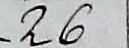26
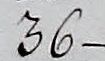36
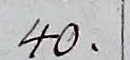40.
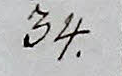34.
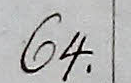64.
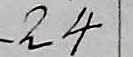24
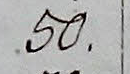50.
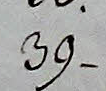39
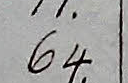64.
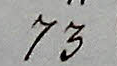73
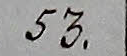53.
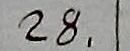28.
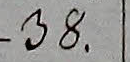38.
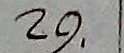29.
